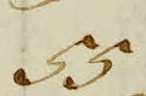55
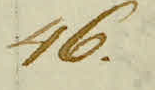46.
